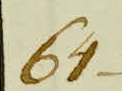64
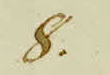8.
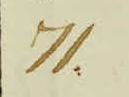71.
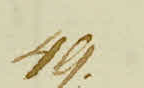49.
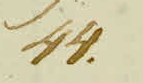44.
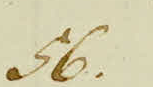56.
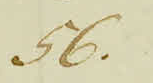56.
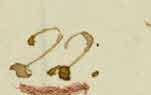22.
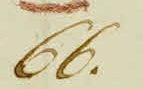66.
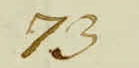73
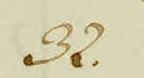32.
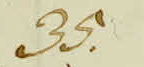35.
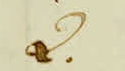2.
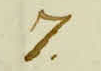7.
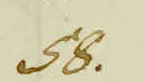58.
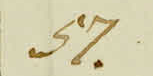57.
